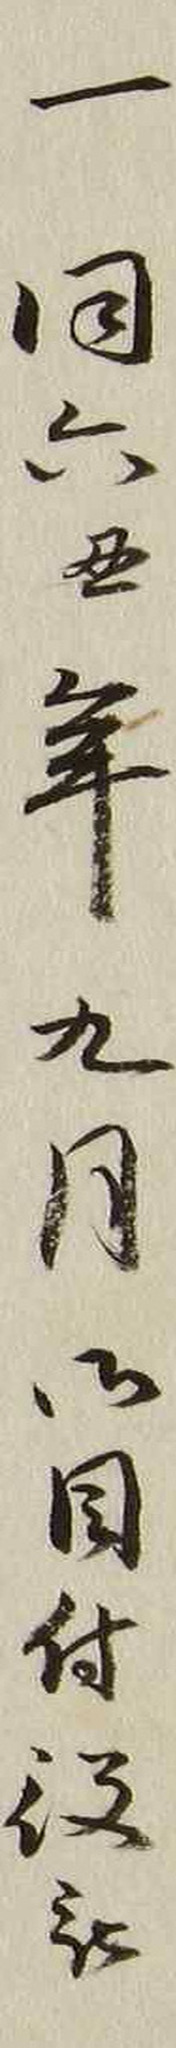一同六丑年九月御目付役被
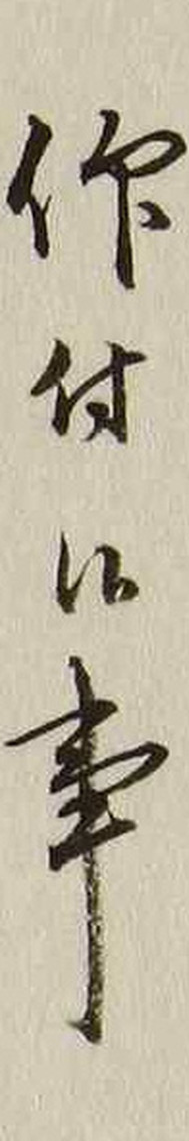仰付候事
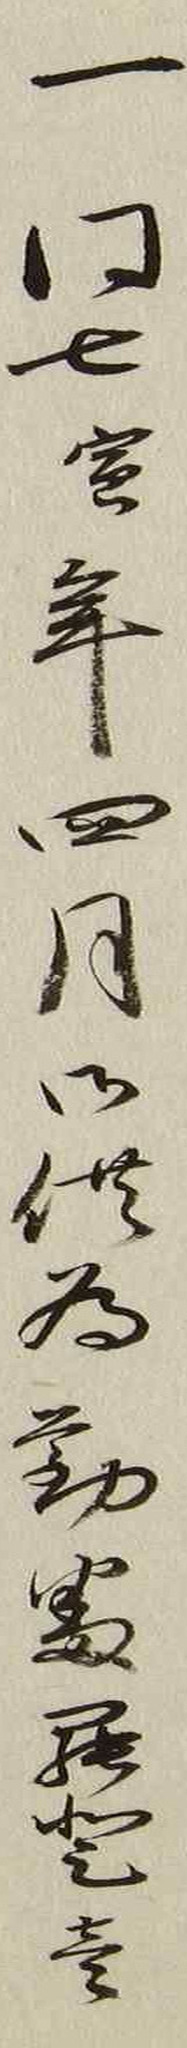一同七寅年四月御供為勤番罷登壱
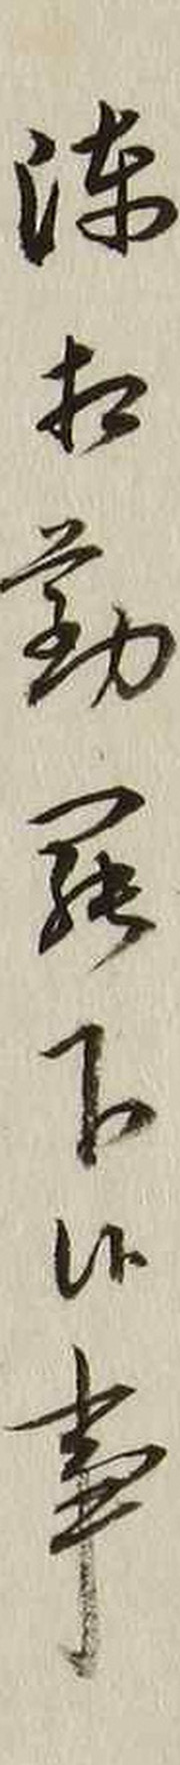陣相勤罷下候事
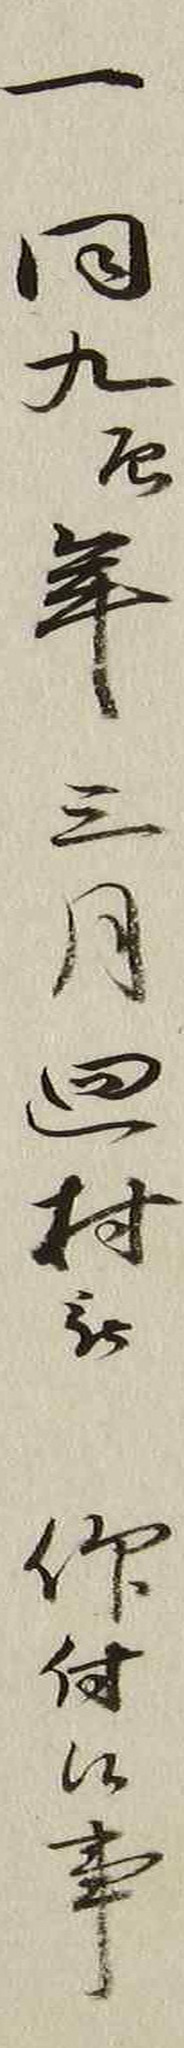一同九辰年三月廻村被仰付候事
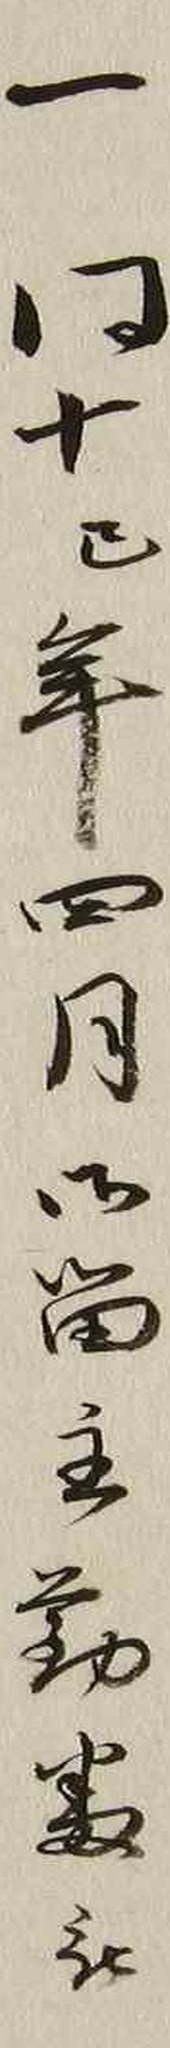一同十巳年四月御留主勤番被
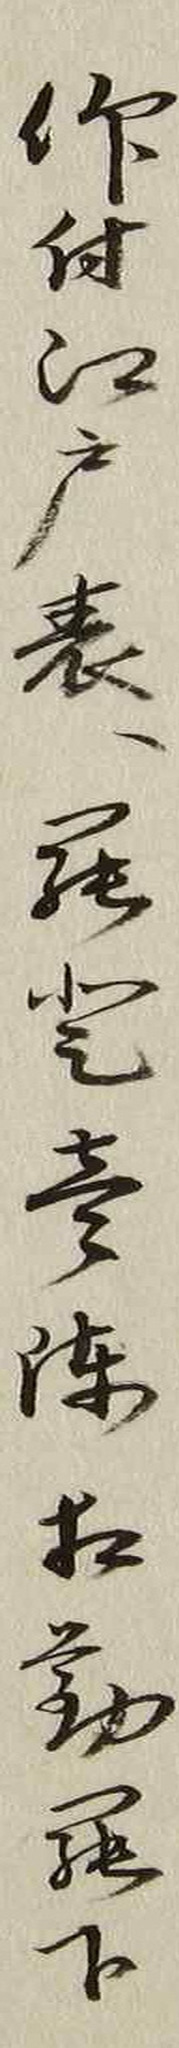仰付江戸表へ罷登壱陣相勤罷下
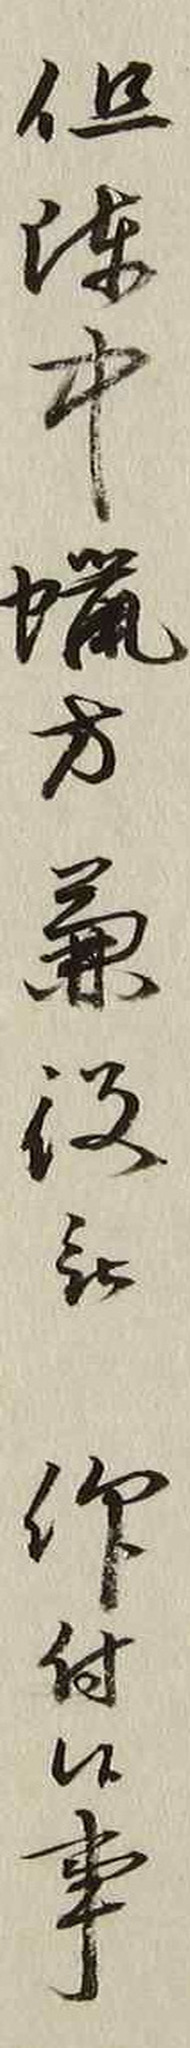但陣中蠟方兼役被仰付候事
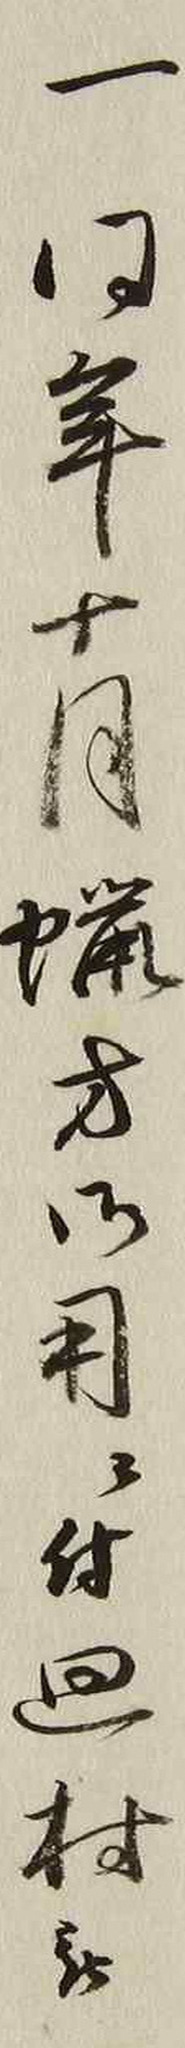一同年十月蠟方御用ニ付廻村被
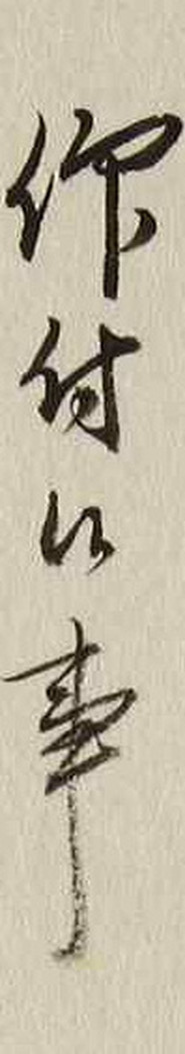仰付候事
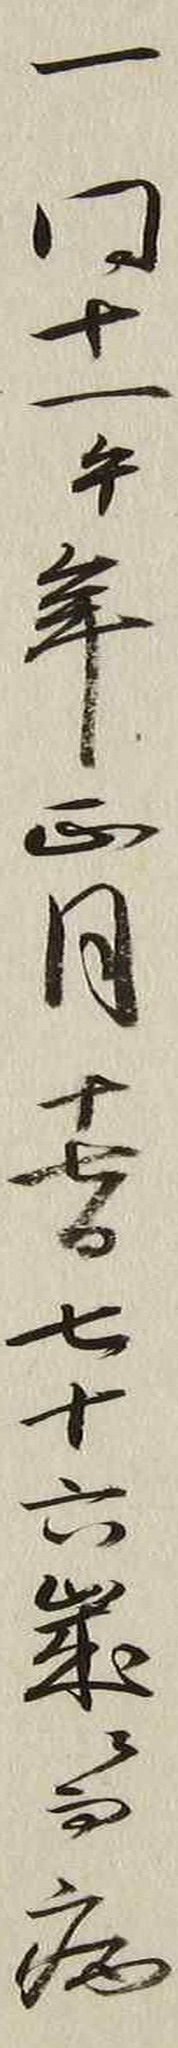一同十一午年正月十七日七十六歳ニて病
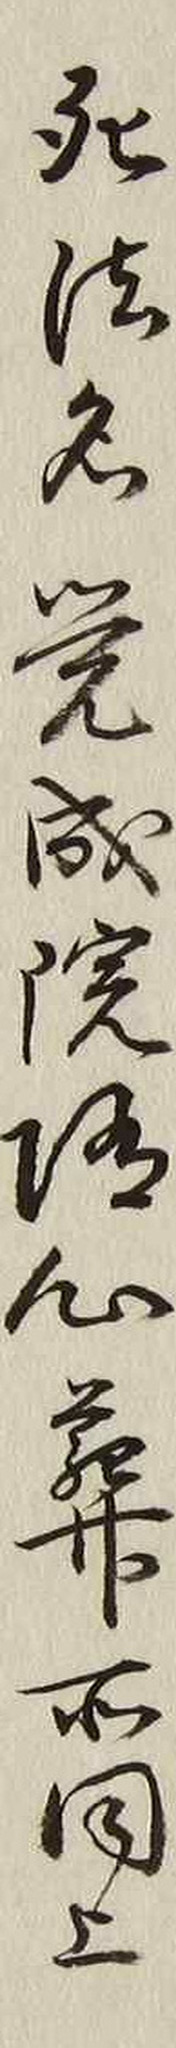死法名覚成院随心葬所同上
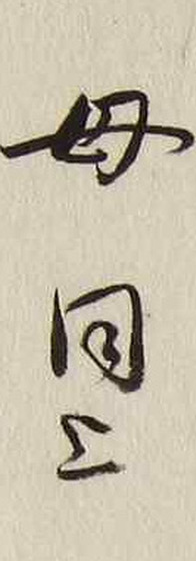母同上

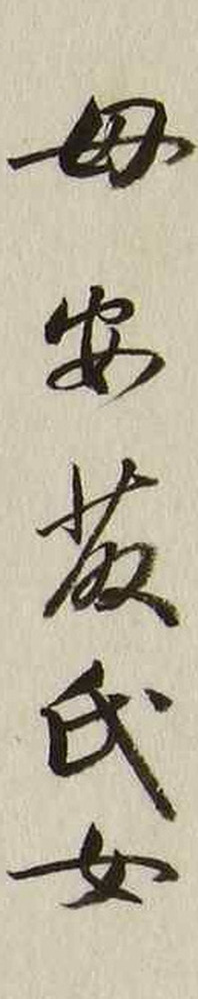母安藤氏女
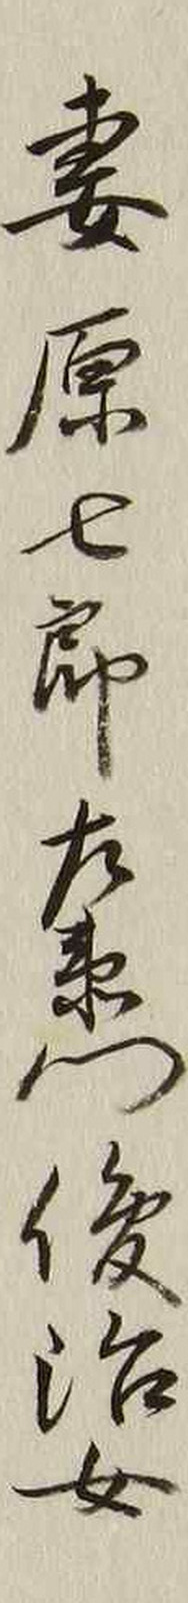妻原七郎左衛門俊治女
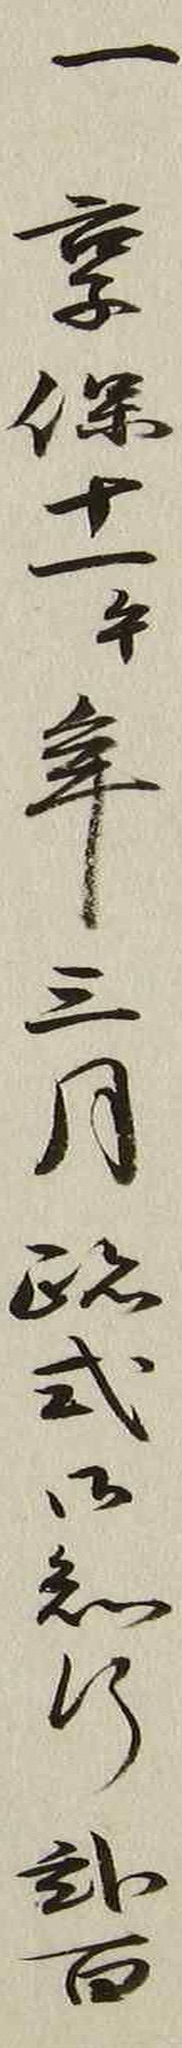一享保十一午年三月跡式御知行弐百
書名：諸士系譜　巻之160　な之部2
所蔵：会津若松市立会津図書館
